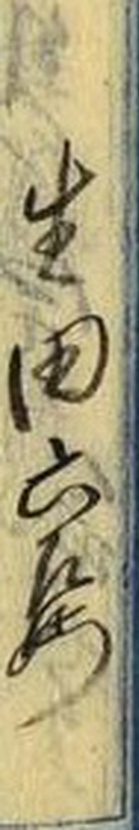生田六左衛門
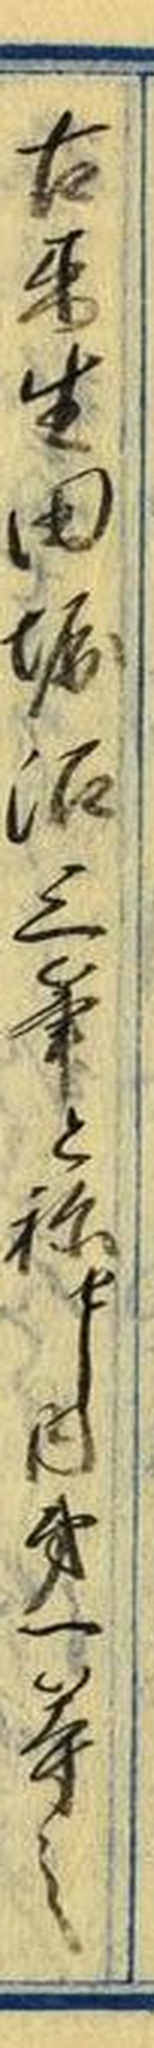古来生田堀沼三筆と称せし内第一等之
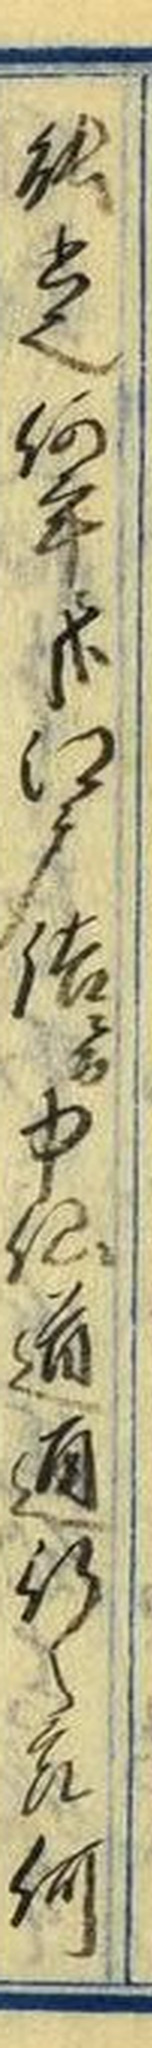能書也何年に哉江戸詰に而中仙道通行之節何
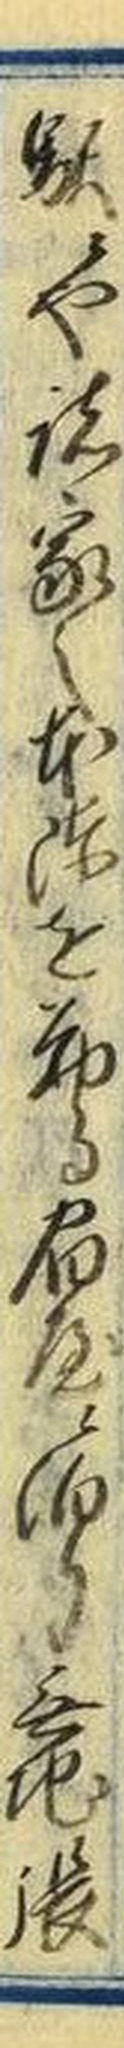駅にや諸家之本陣を勤る宿屋に泊り無地張
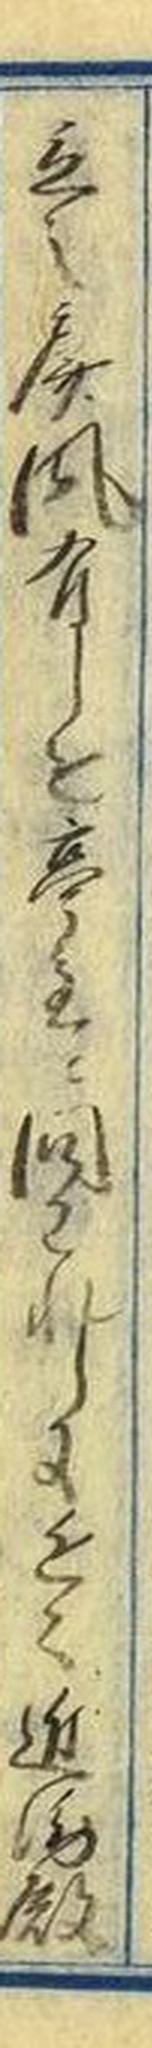立之屏風有しを亭主に問われしに近々近衛殿
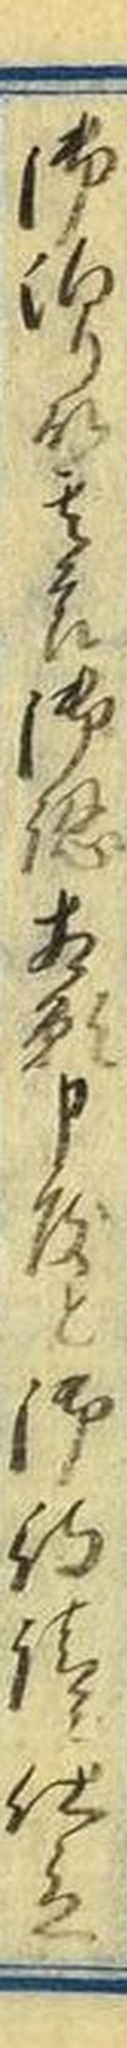御泊り故其節御認相願申度と御待請に仕立
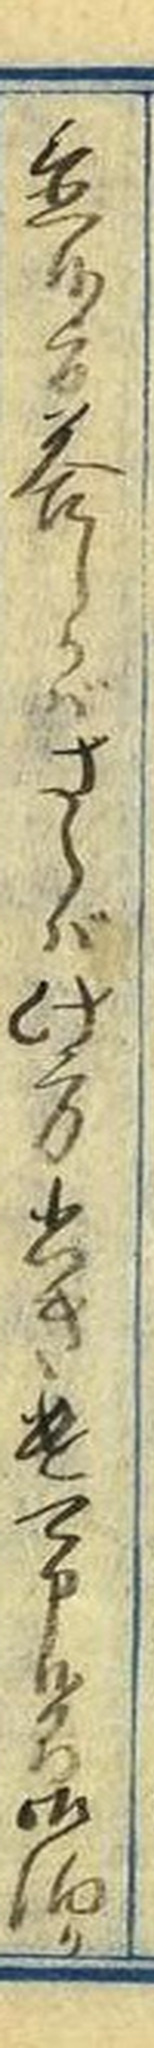置候旨答しかばさらば此方書き遣可申候間御泊り
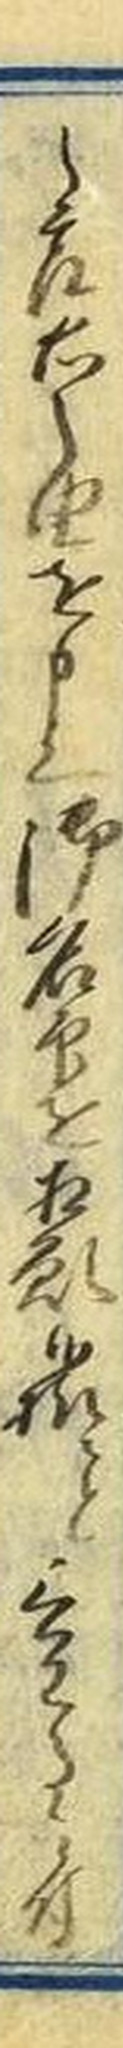之節右之由を申上御名印を相願候様にと言わるゝに付
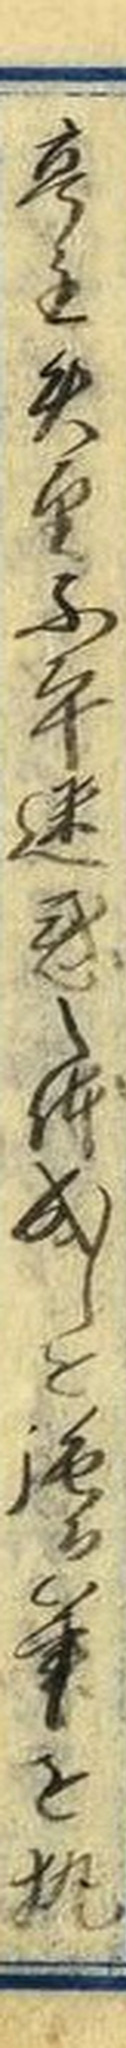亭主失望不平迷惑之体成しを強而筆を執
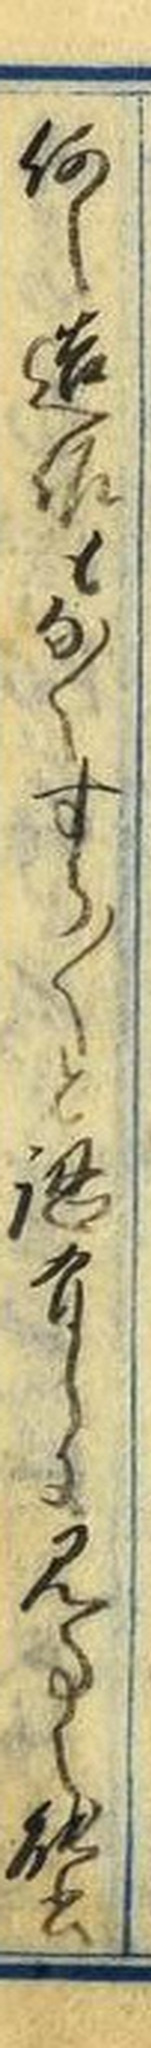何之造作もなくすら〳〵と認有しに見事之能書

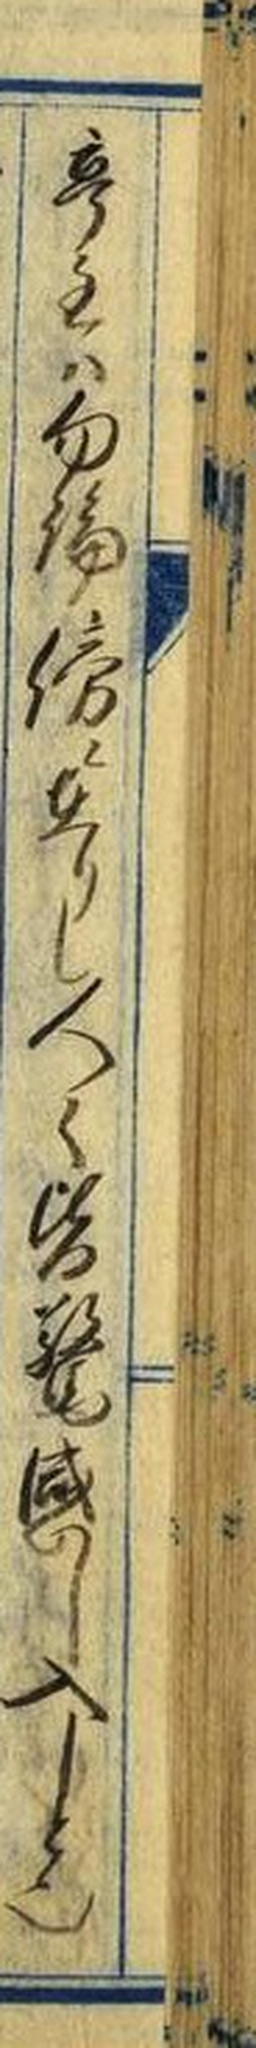亭主は勿論傍に在りし人々皆驚感し入しと也
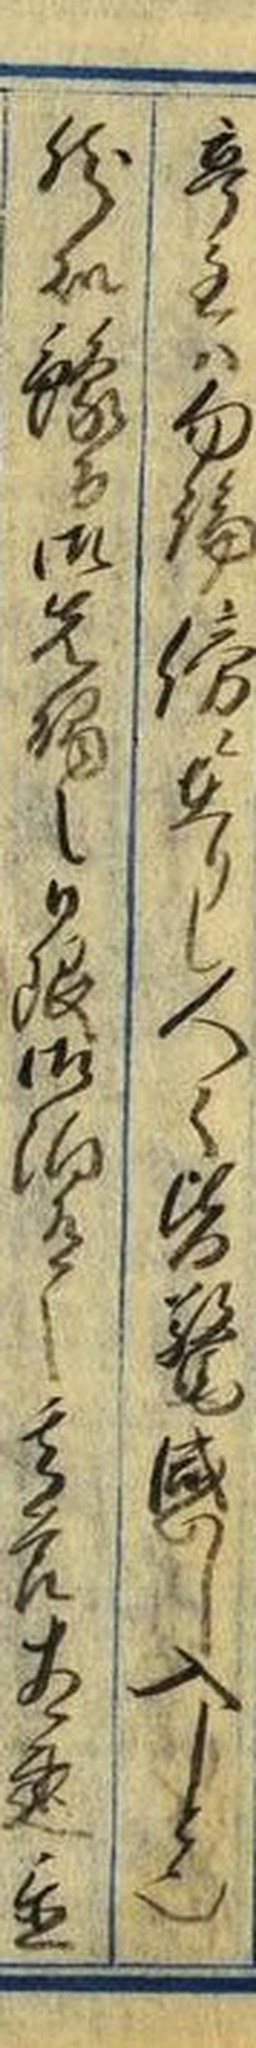然処予而御先触之日限御泊有之其節相建置
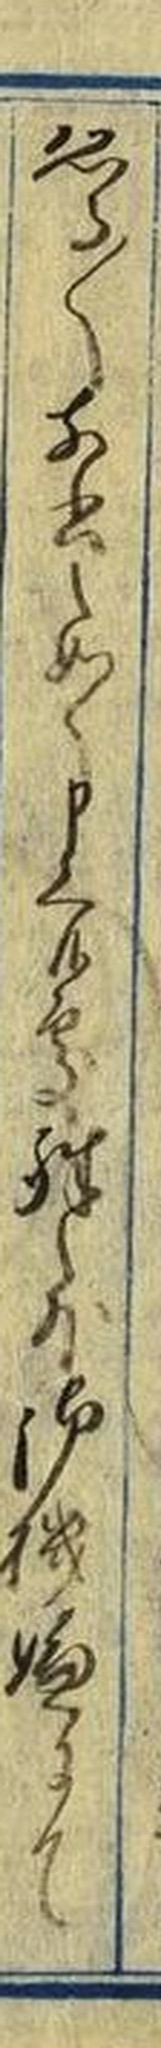恐る〳〵前書之如く申上候処殊之外御機嫌にて
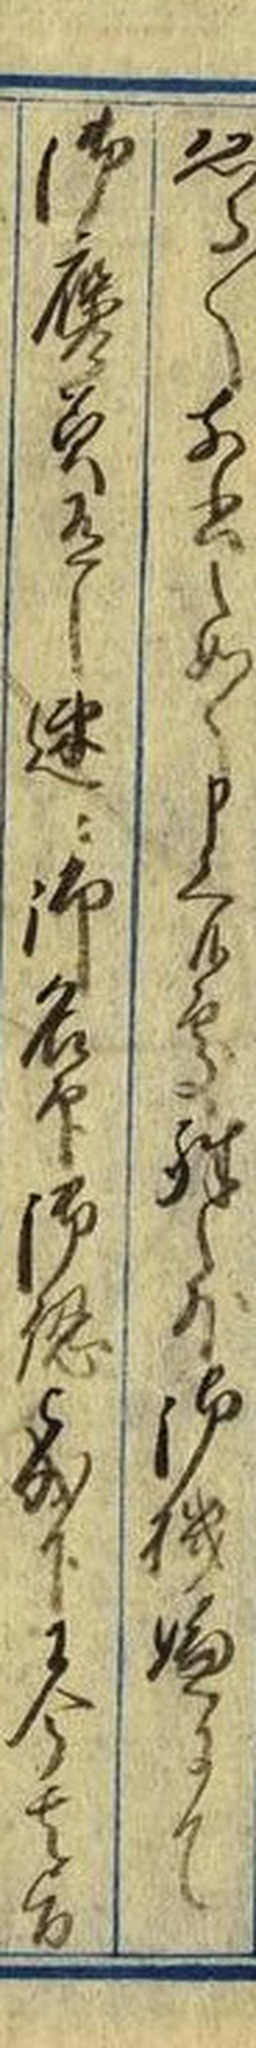御褒美有之速に御名印御認被成下于今其旨
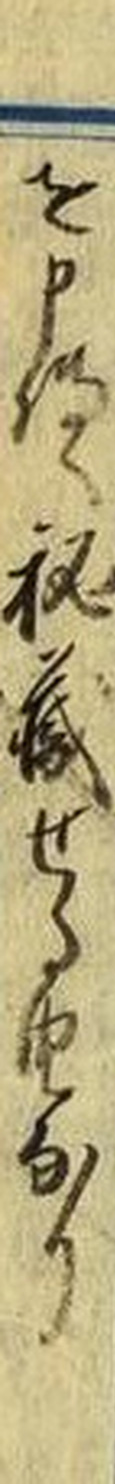を申伝へ秘蔵せる由なり
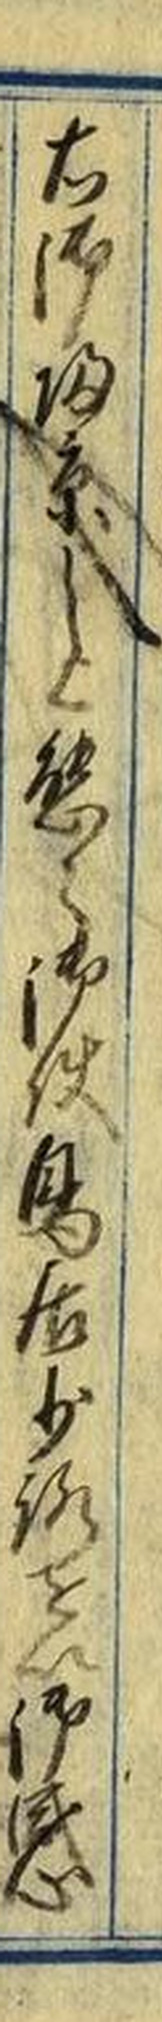右御帰京之上態々御使鳥居少路を以御感
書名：温古集 四巻
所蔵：福井県文書館 Fukui Prefectural Archives
